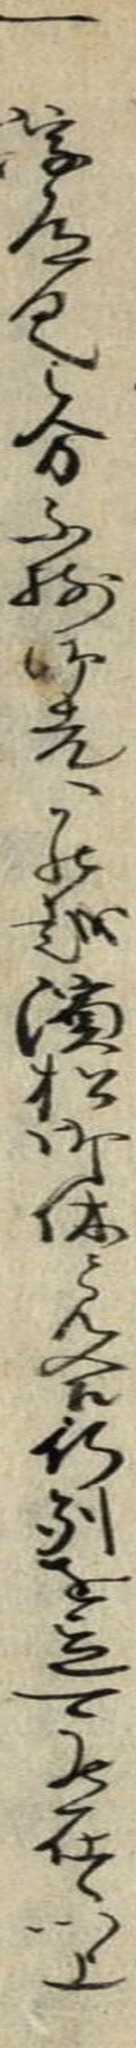一浮道具之分不揃御先へ罷越浜松御休に見合行列を立可罷在候以上
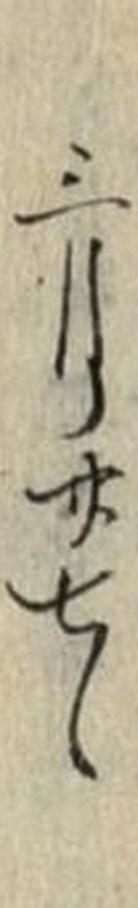三月廿六日
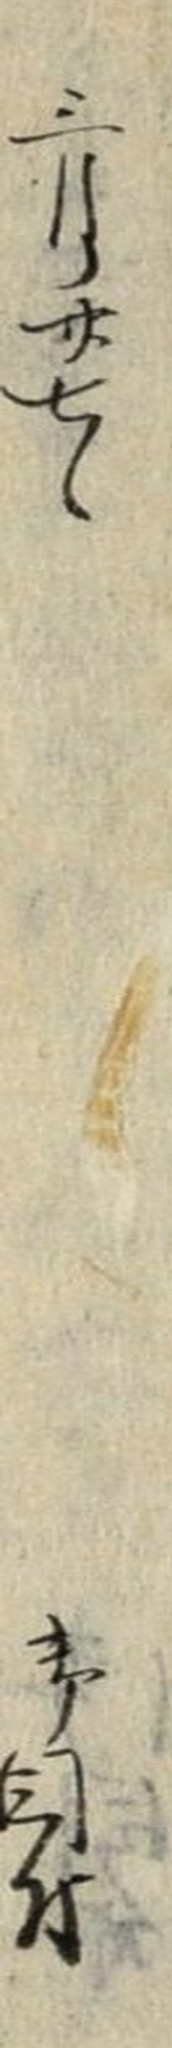三月廿七日御目付
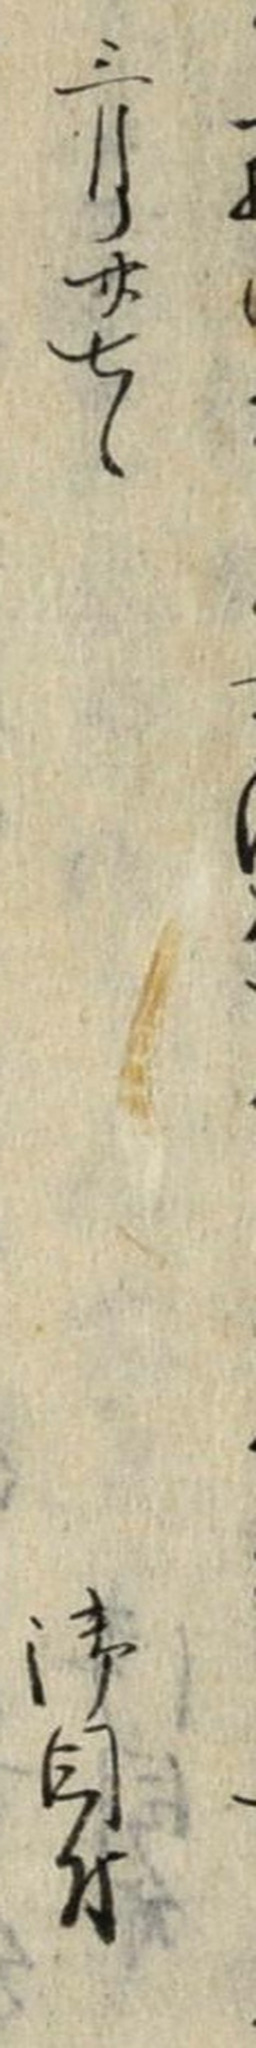三月廿七日御目付
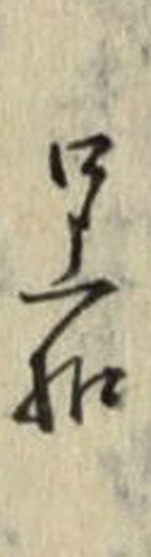口上扣
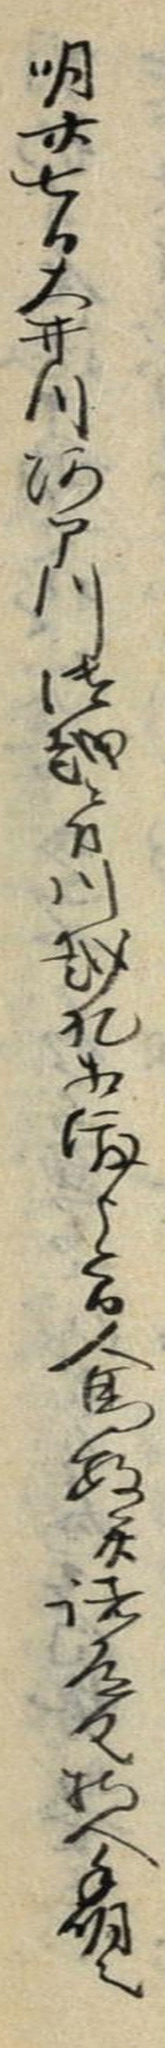明廿七日大井川阿部川御越に付川越札相渡申候間人馬数并諸道具持人手明之
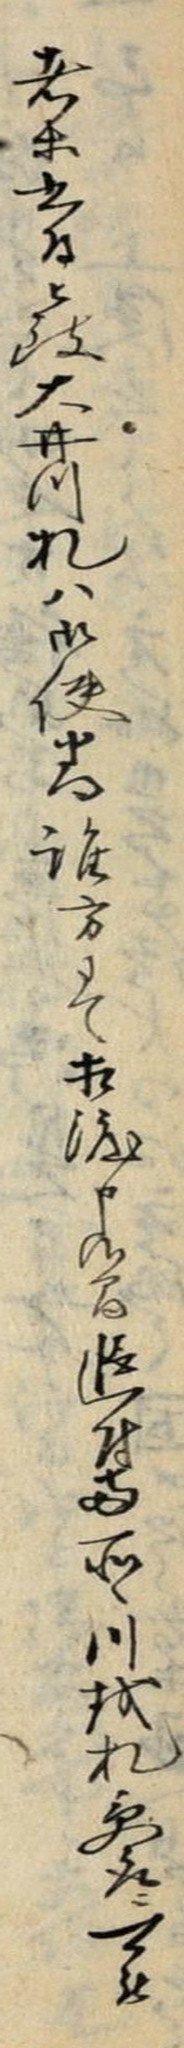者等書付被致大井川札は御使番誰方にて相渡申候間追付両所へ川越札受取に可被
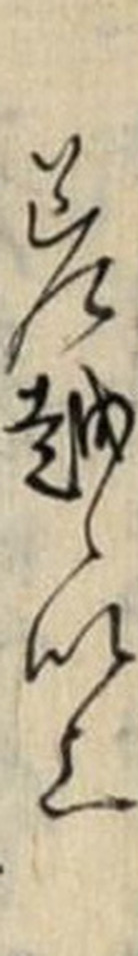差越候以上
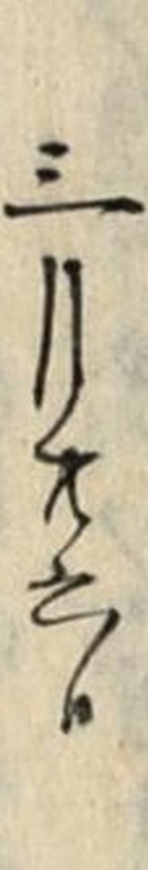三月廿六日
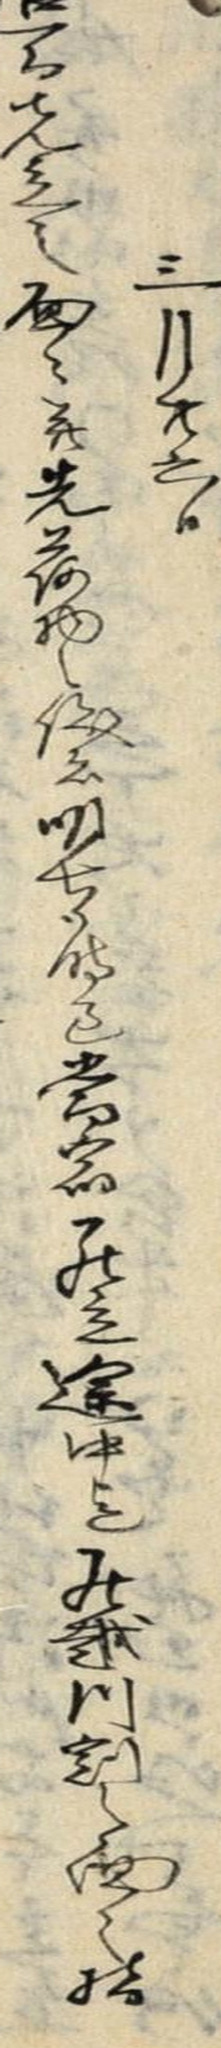追て先立之面々并先荷物之儀は明七ツ時過当宿罷立途中迄罷越川割之面々指
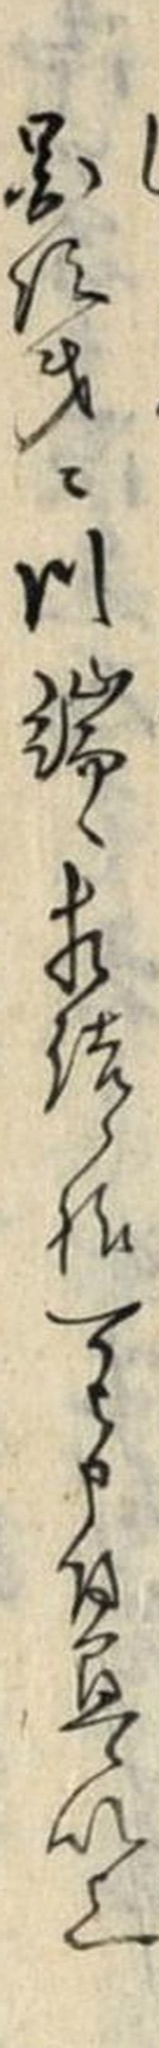図次第に川端へ相詰候様可被申付置候以上
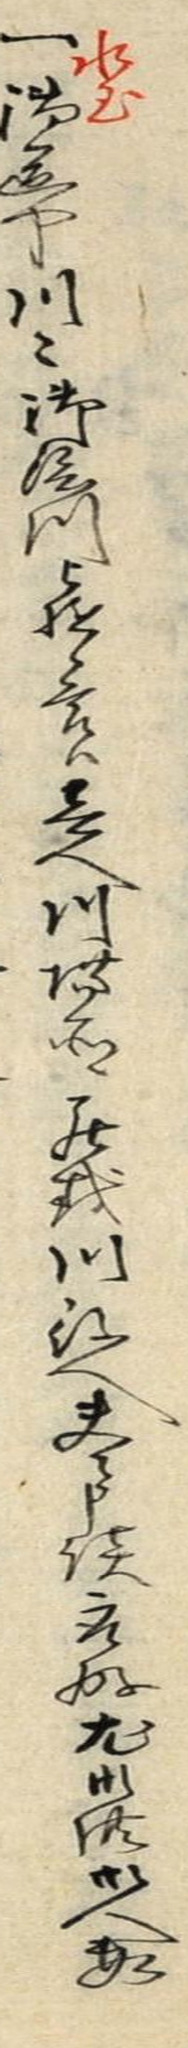一御道中川々御渡川被遊候節は壱人川場所へ罷越川役人夫々申談取扱尤御供御人数
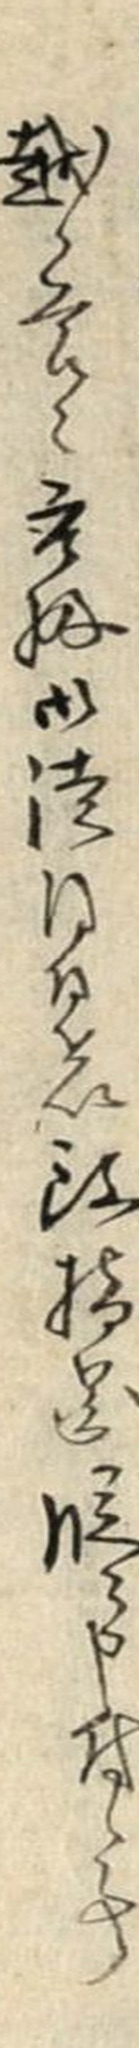越候節々取扱御徒目付を以致指図段々申付候事

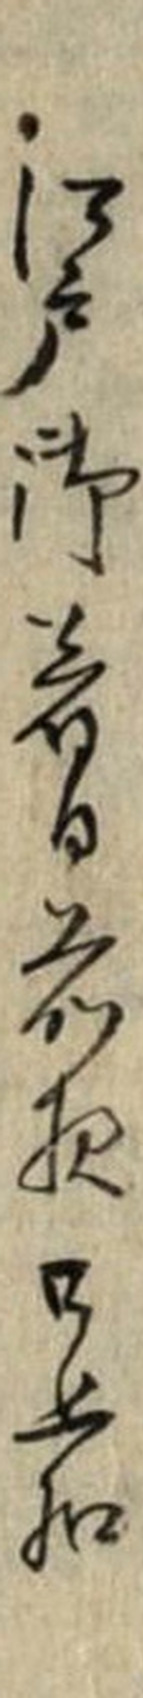江戸御着日前夜口上扣
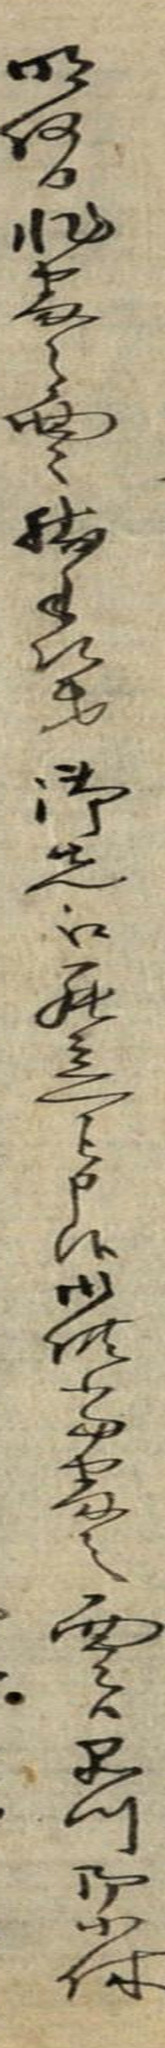明何日非番之面々勝手次第御先江罷立可被申候御供当番之面々は品川御小休
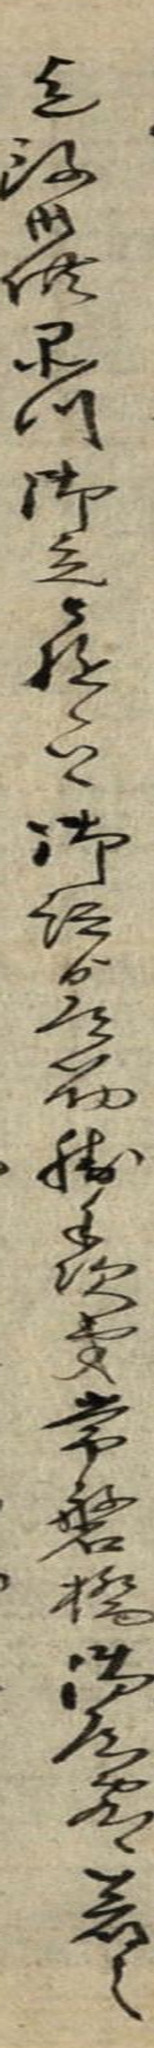迄致御供品川御立被遊候はゝ御跡ゟ道筋勝手次第常盤橋御屋敷へ着之
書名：三都并道中之部
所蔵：福井県文書館 Fukui Prefectural Archives
